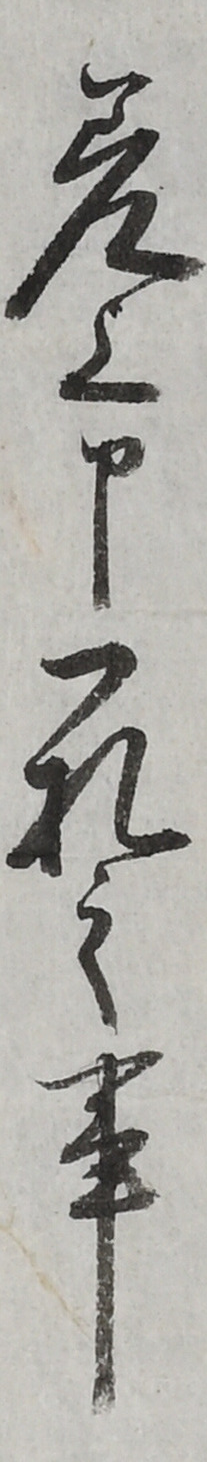差上申一札之事
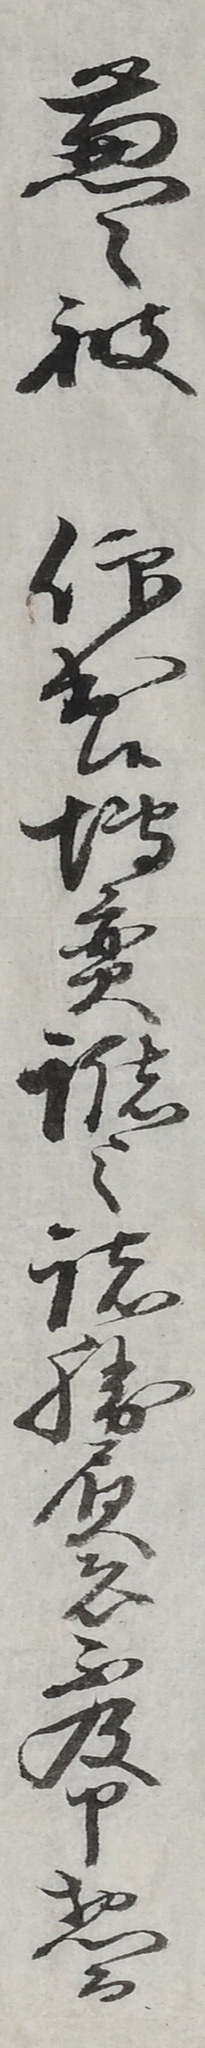兼々被仰出候博奕賭之諸勝負者不及申惣而
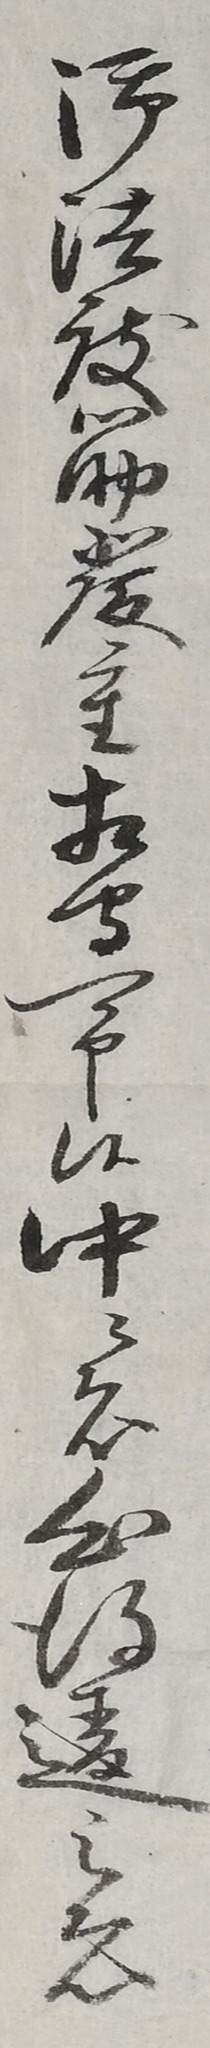御法度筋厳重相守可申候中ニ者心得違之者
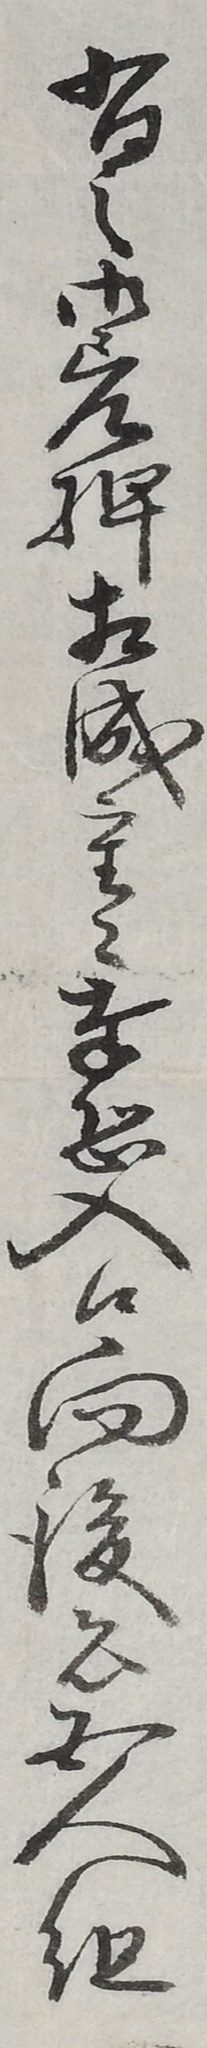有之御差押相成重々奉恐入候向後者五人組
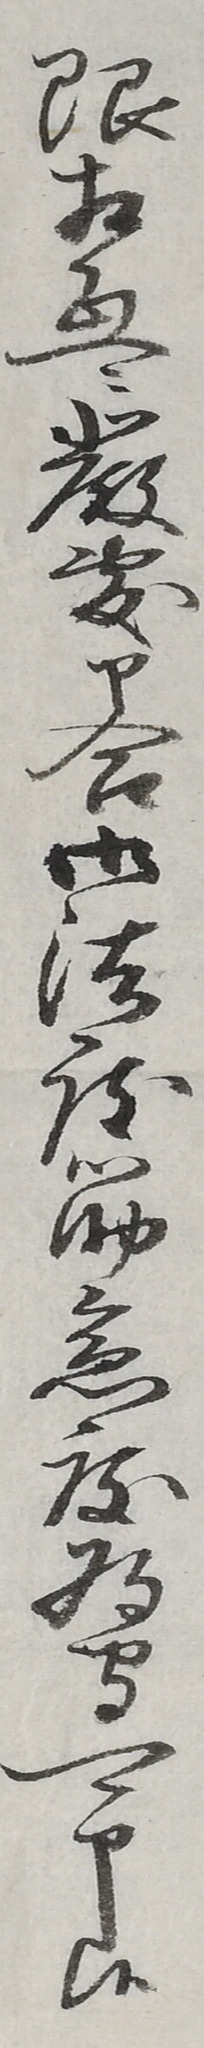限相互ニ厳敷申合御法度筋急度為守可申候
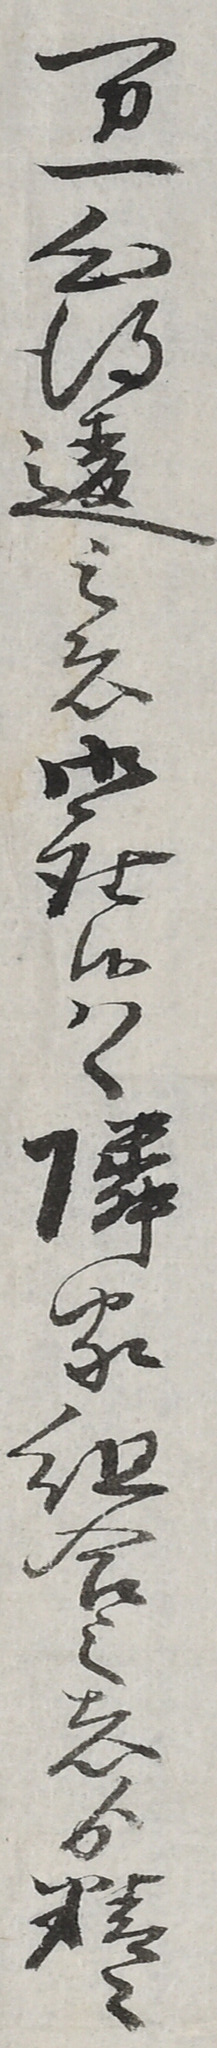万一心得違之者御座候ハゝ隣家組合之者ゟ精々
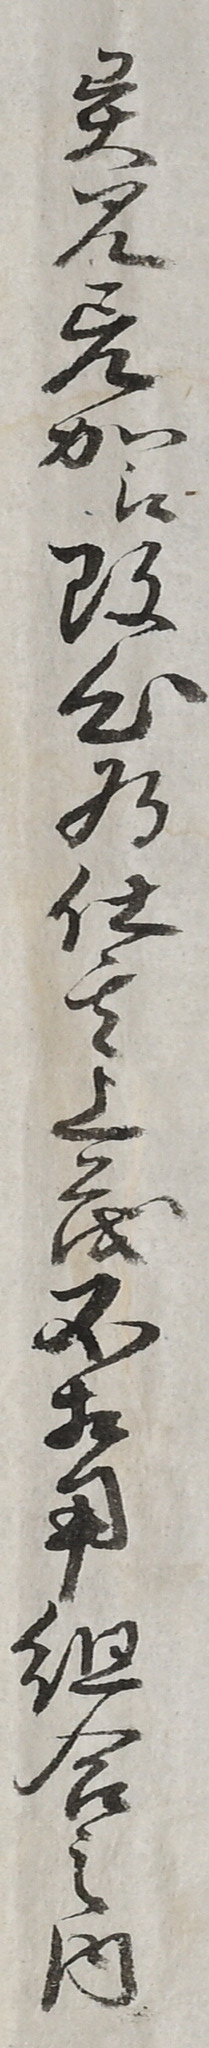異見差加江改心為仕其上茂不相用組合之内
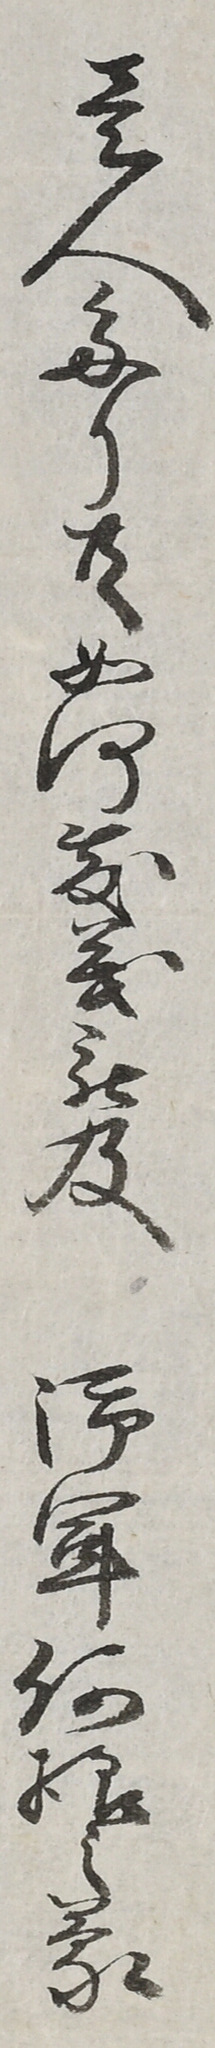壱人たり共如何敷義被及御聞何様之蒙
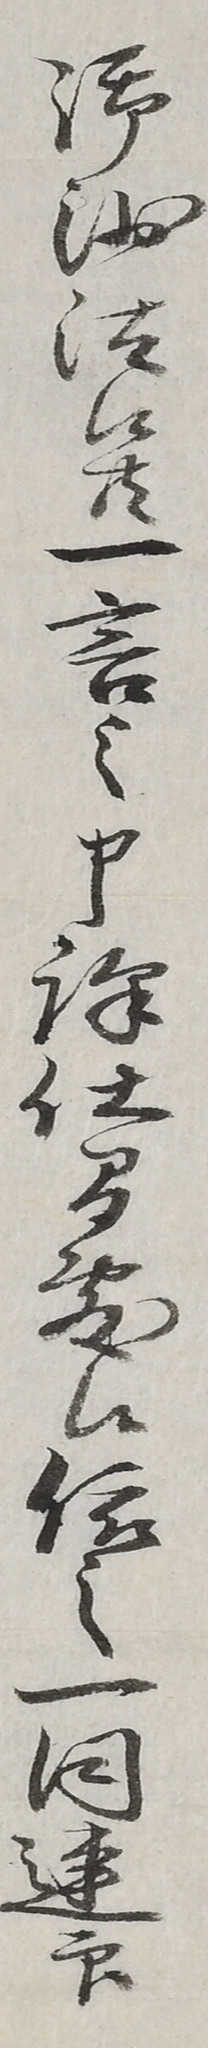御沙汰候共一言之申訳仕間敷候依之一同連印
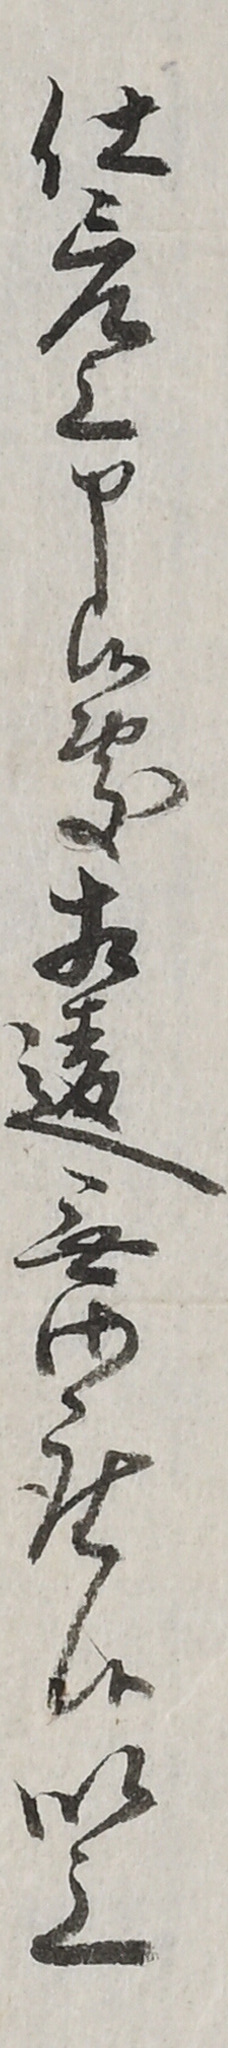仕差上申候処相違無御座候以上
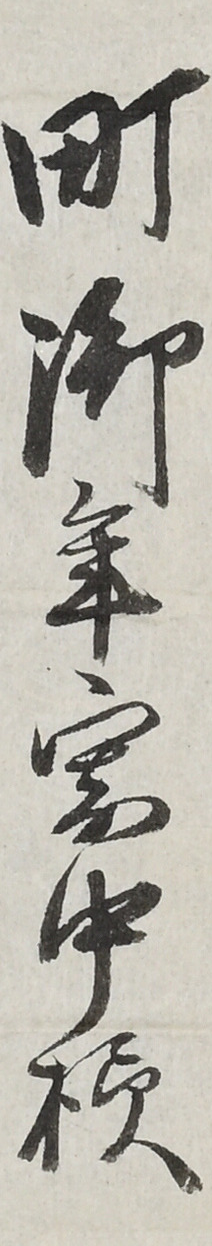町年寄中様
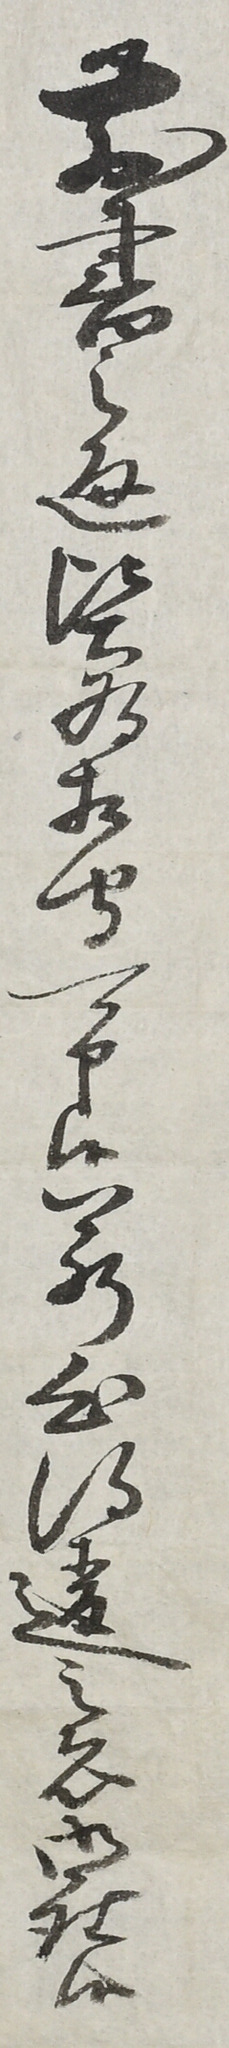前書之通堅為相守可申候若心得違之者御座候
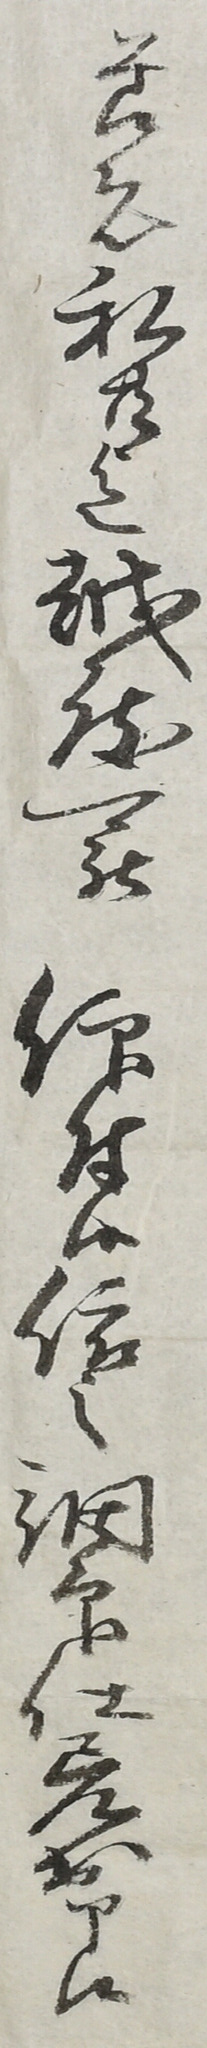節者私共迄越度可被仰付候依之調印仕差出申候

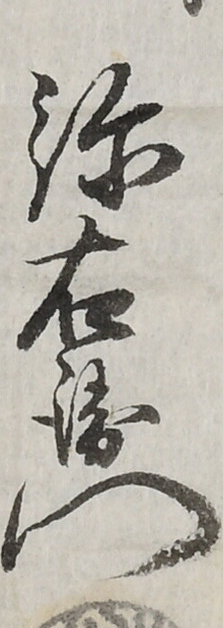勘右衛門
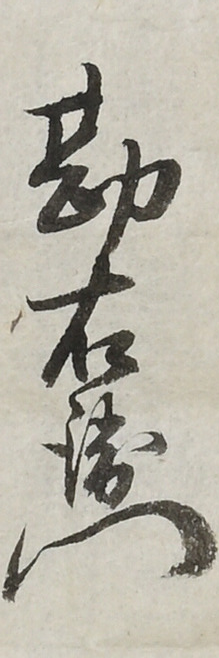勘右衛門

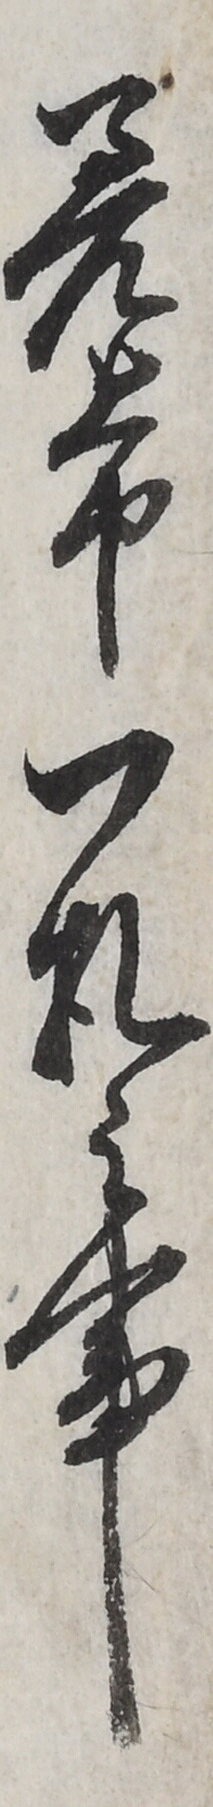差上申一札之事
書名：差上申一札之事
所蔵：伊那市立高遠町図書館・合同会社AMANE
